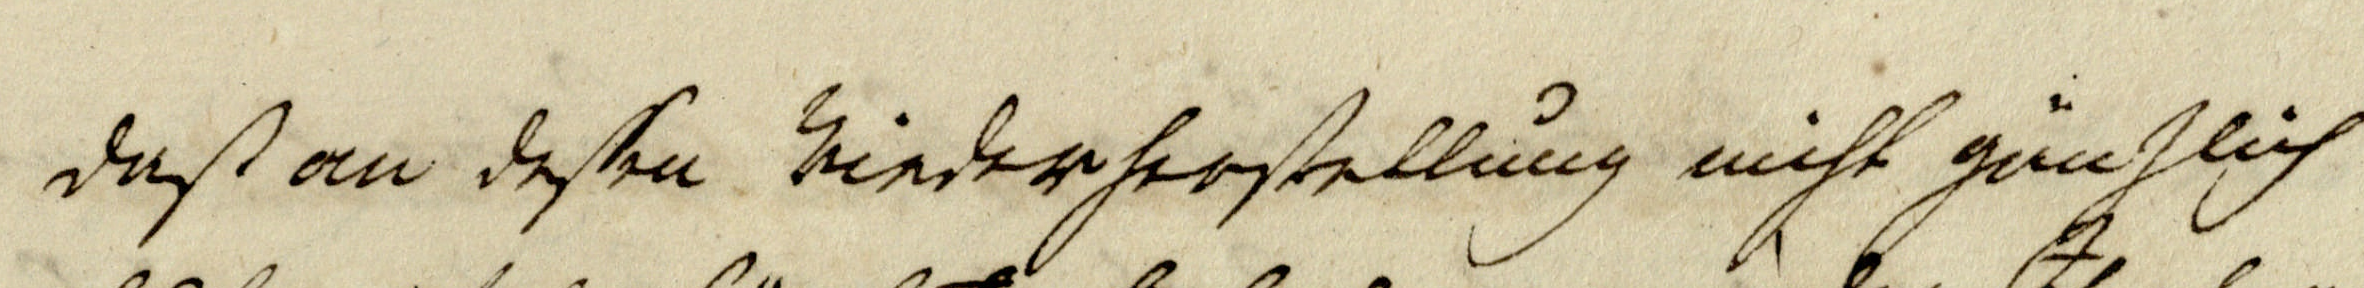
daß an dessen Wiederherstellung nicht gänzlich
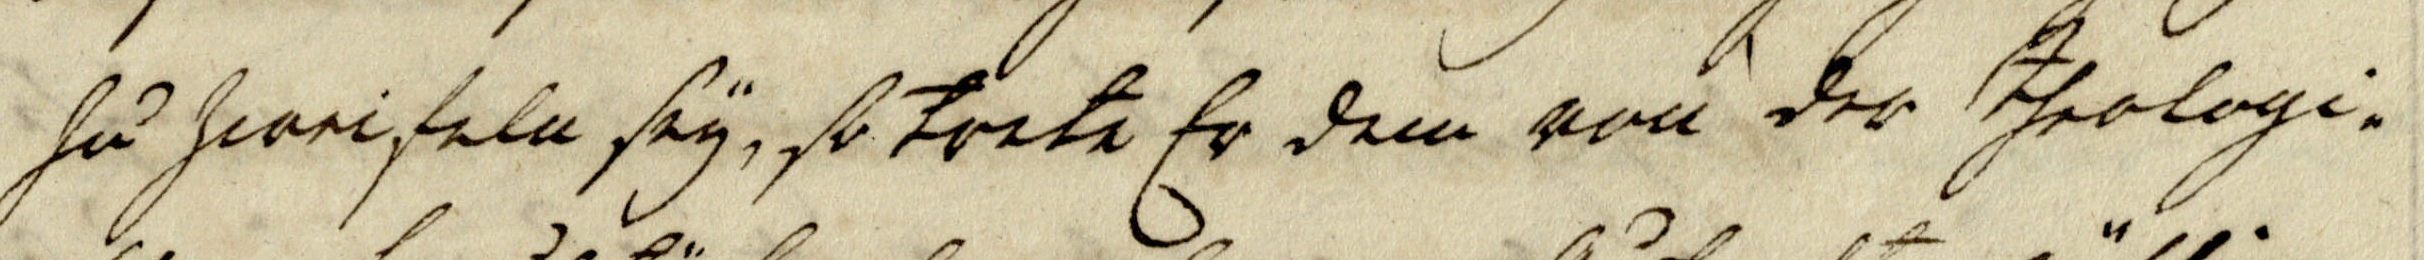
zu zweifeln seÿ, so trete Er dem von der Theologi¬
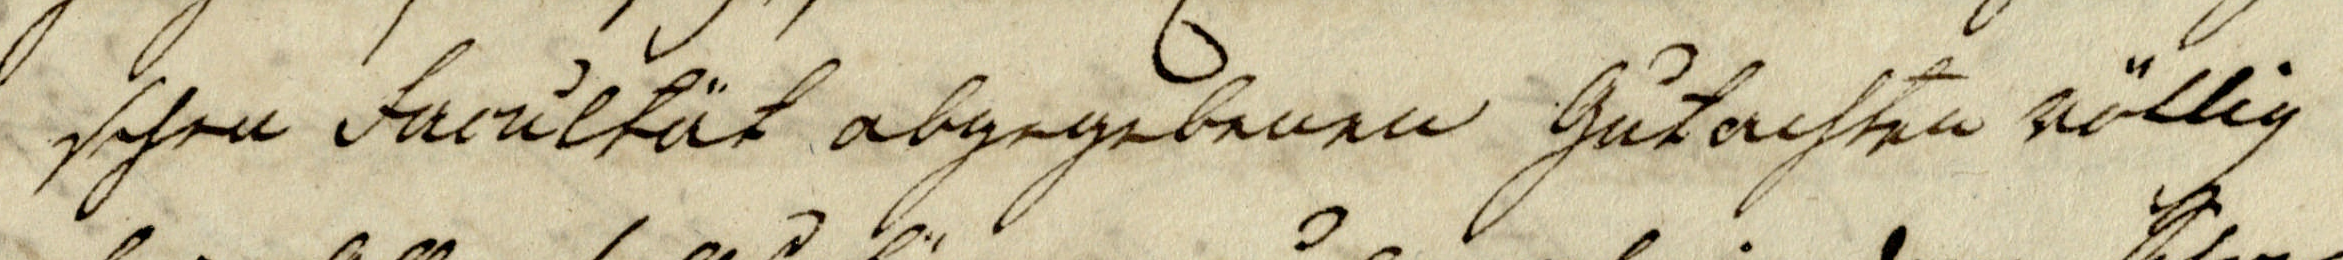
schen Facultät abgegebenen Gutachten völlig
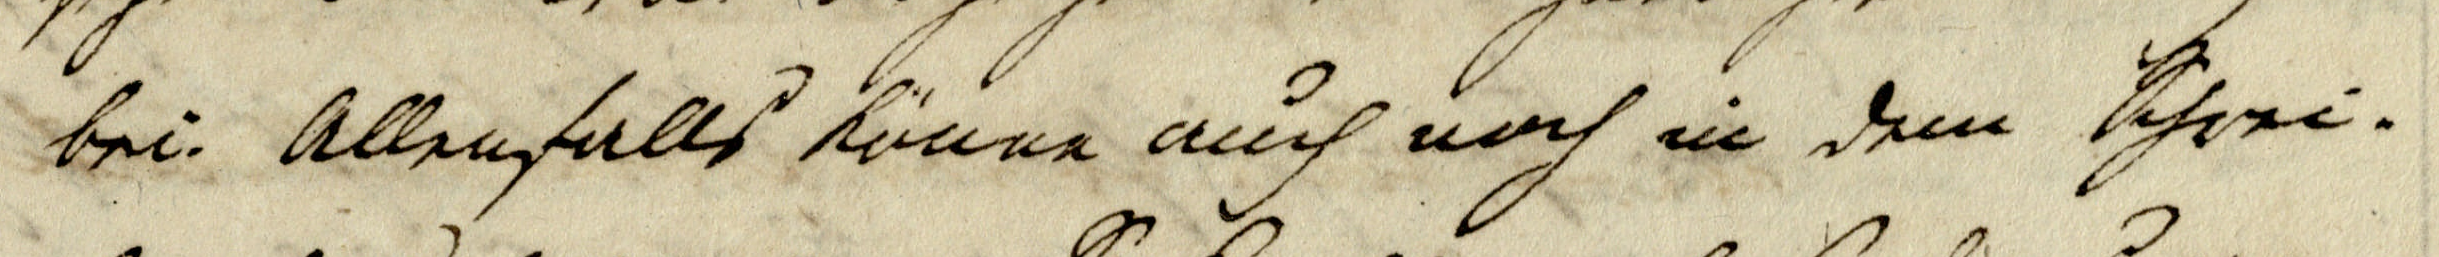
bei. Allenfalls könne auch noch in dem Schrei¬
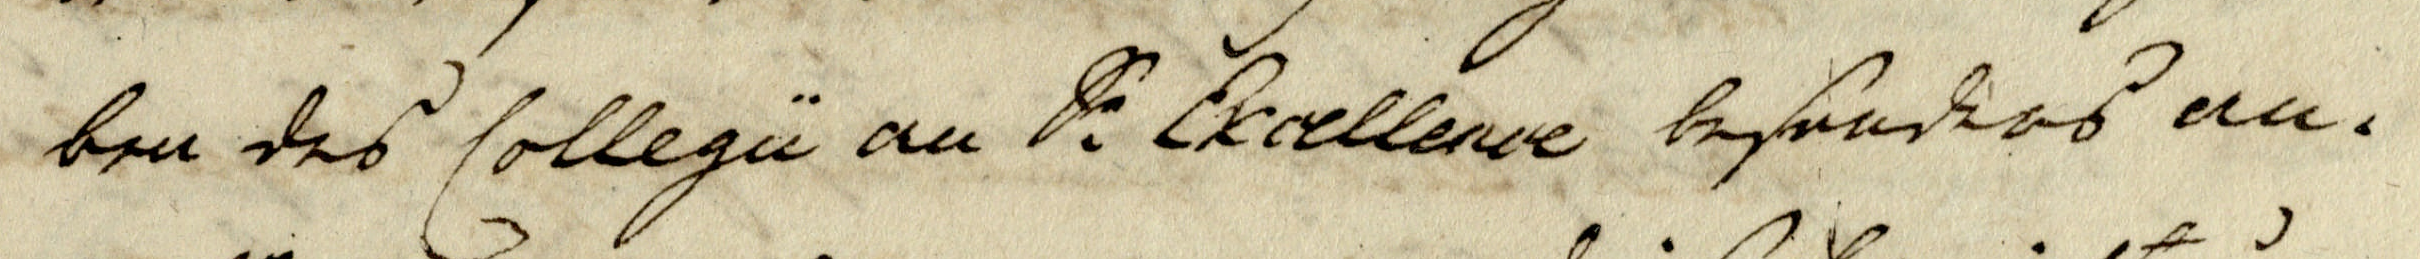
ben des Collegii an Sr Excellence besonders an¬
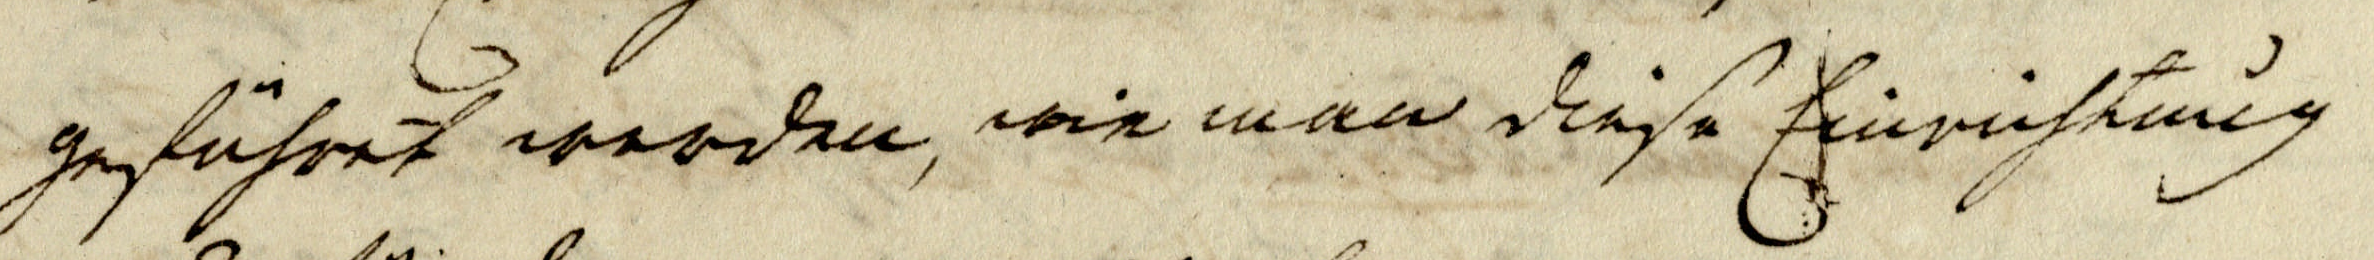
geführet werden, wie man diese Einrichtung
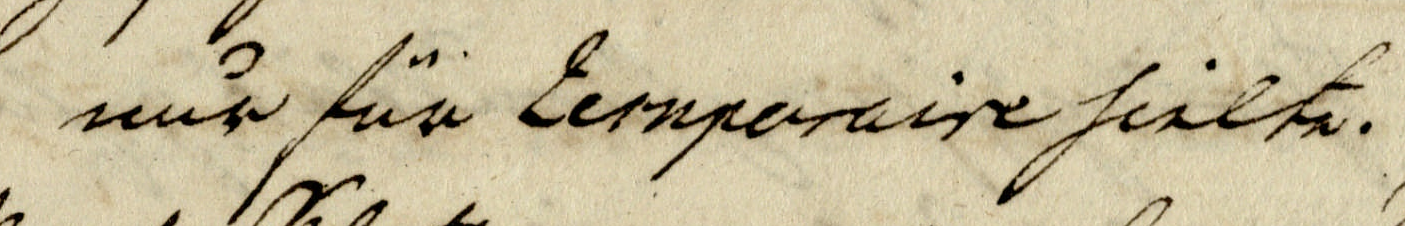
nur für temporaire hielte.
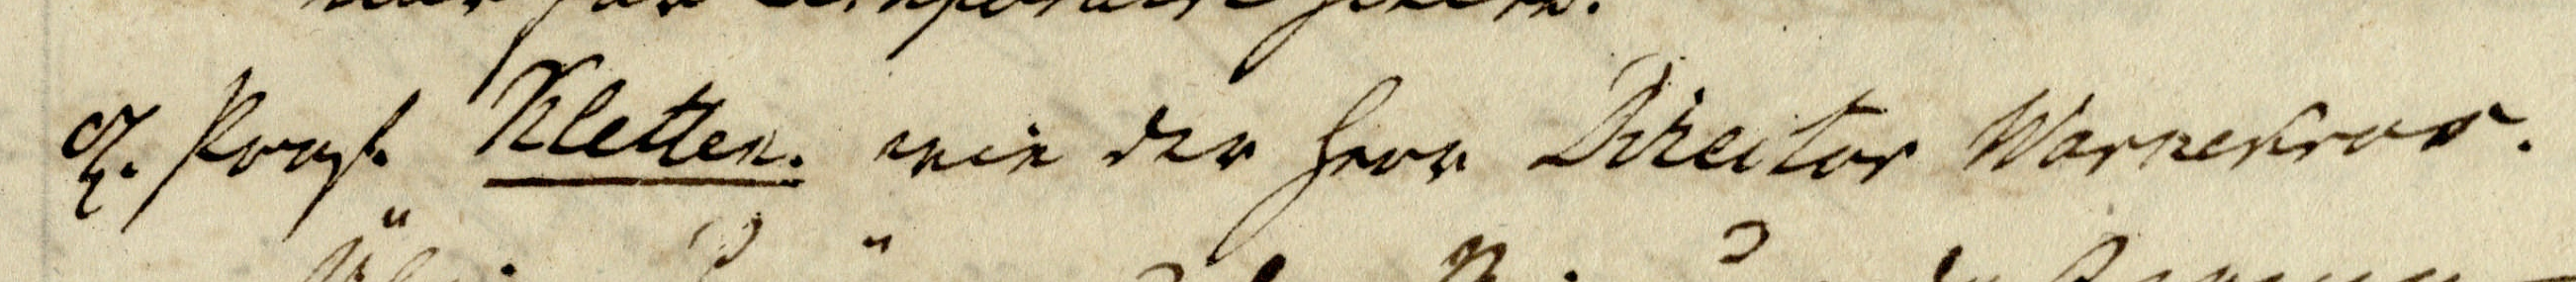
dh. Prof. Kletten. wie der Herr Director Warnekros.
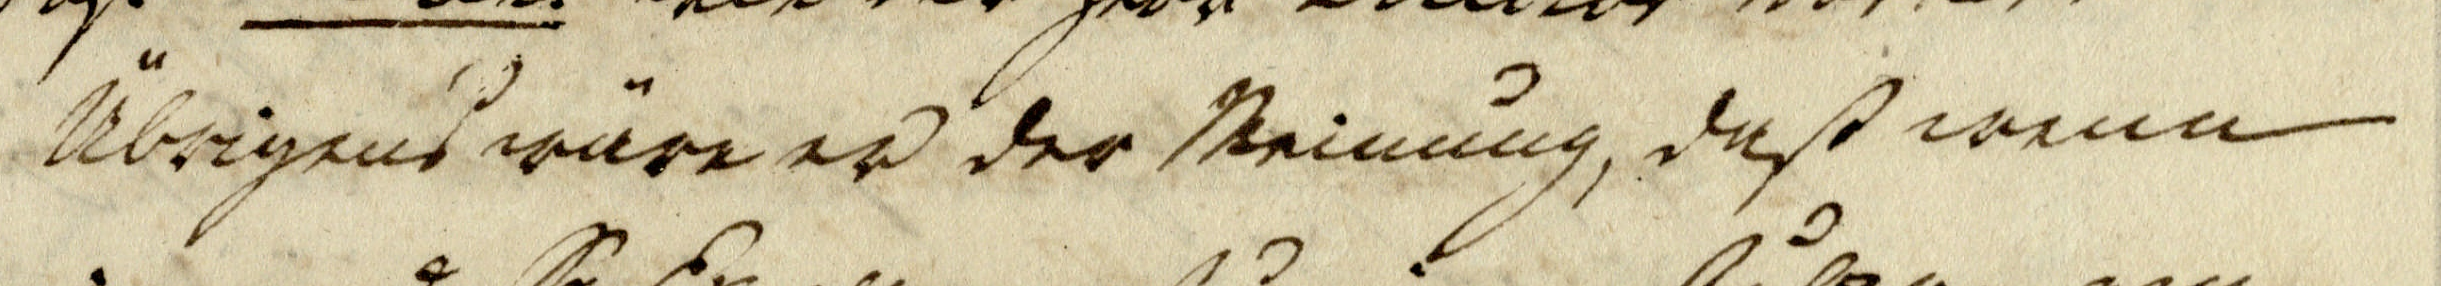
Übrigens wäre er der Meinung, daß wenn
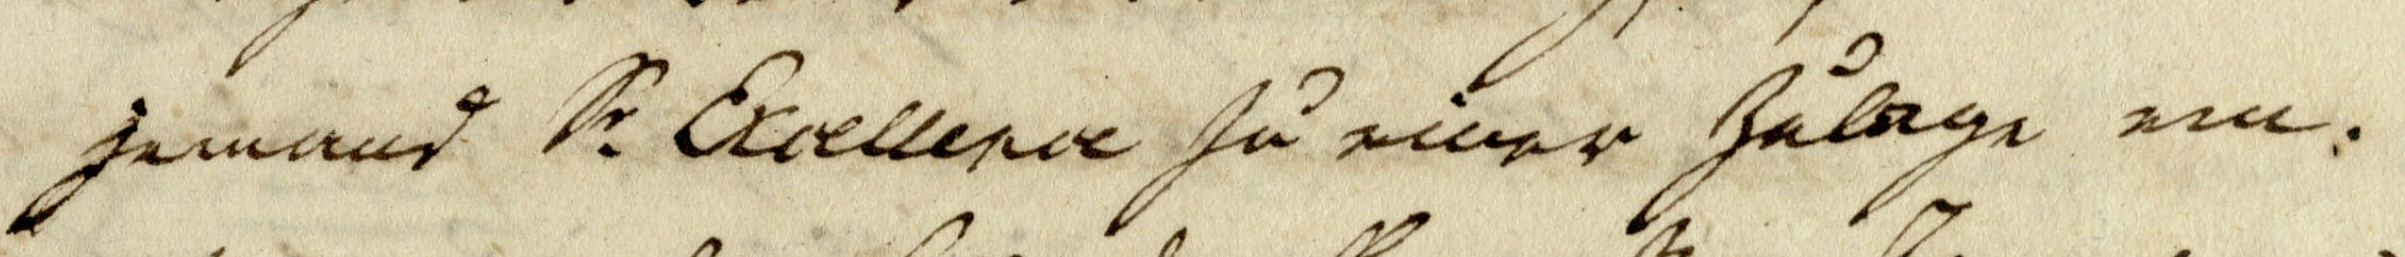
jemand Sr Excellence zu einer Zulage em¬
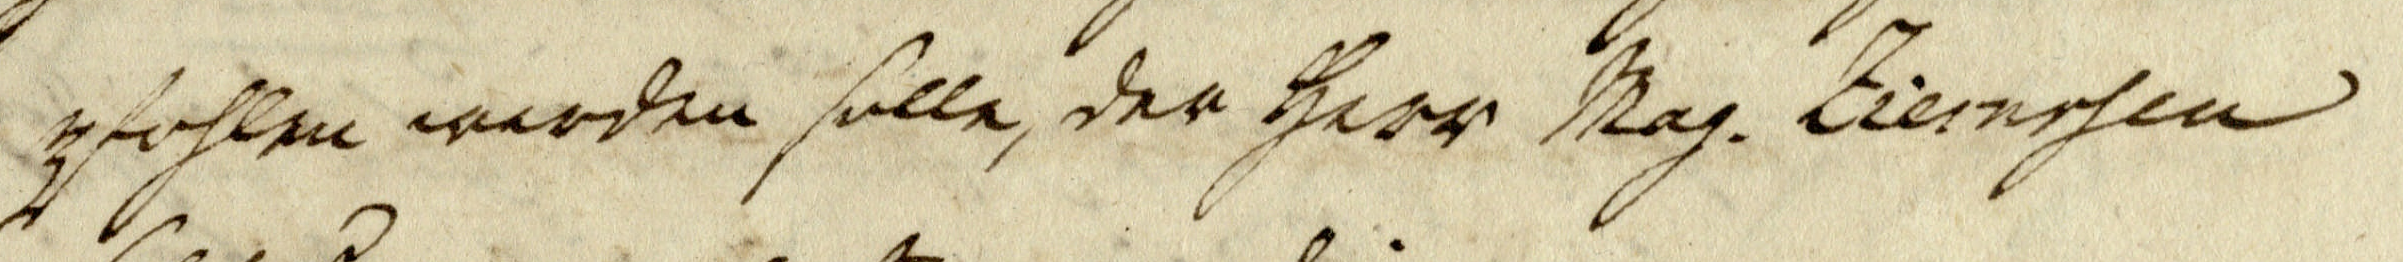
pfohlen werden solle, der Herr Mag. Ziemssn
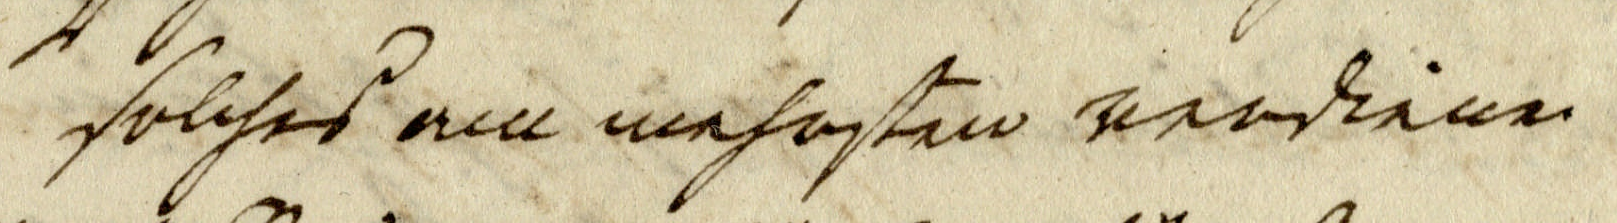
solches am mehrsten verdiene.
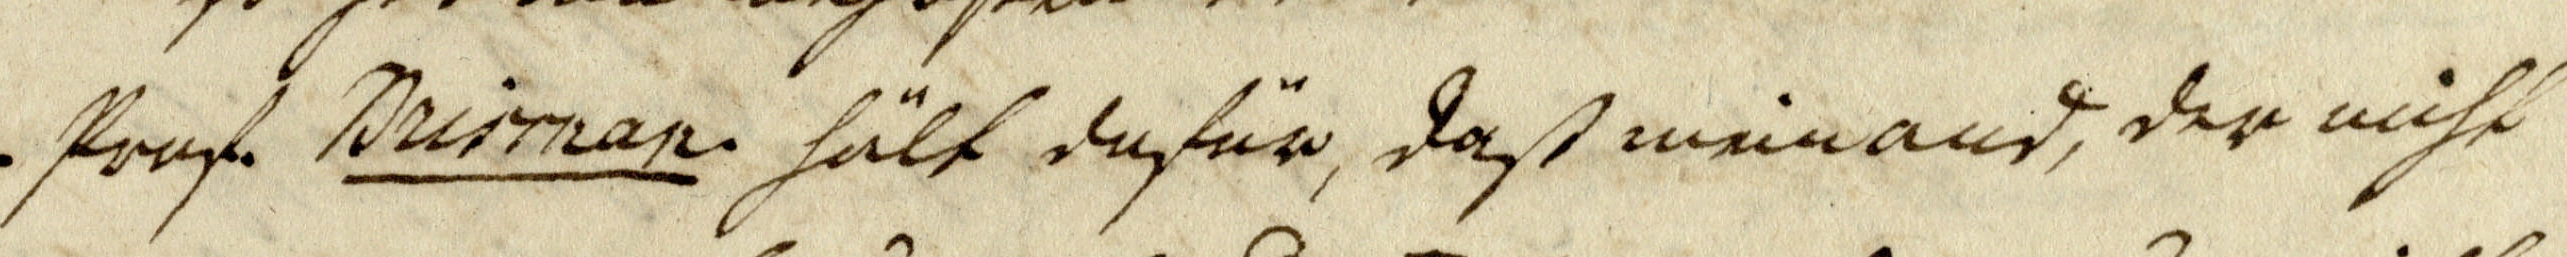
Prof. Brisman. hält dafür, daß niemand, der nicht
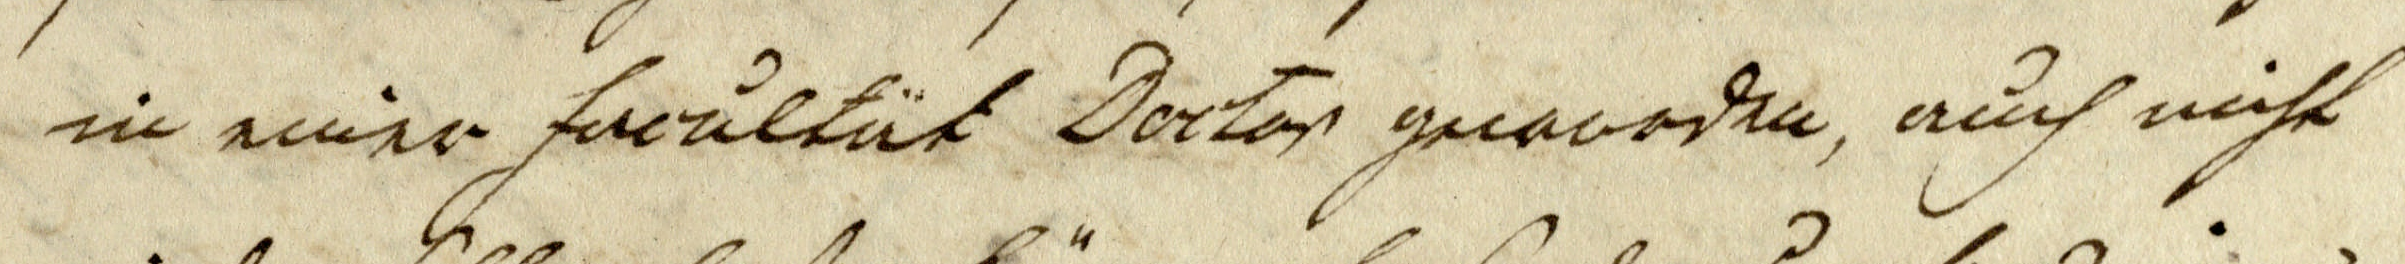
in einer Facultät Doctor geworden, auch nicht
